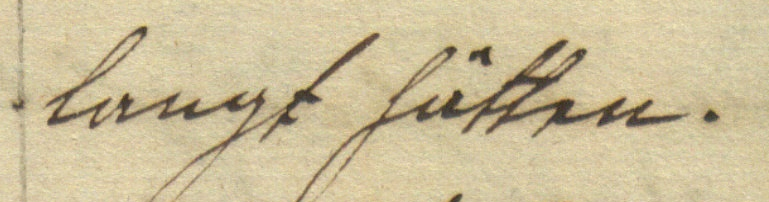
langt hätten.
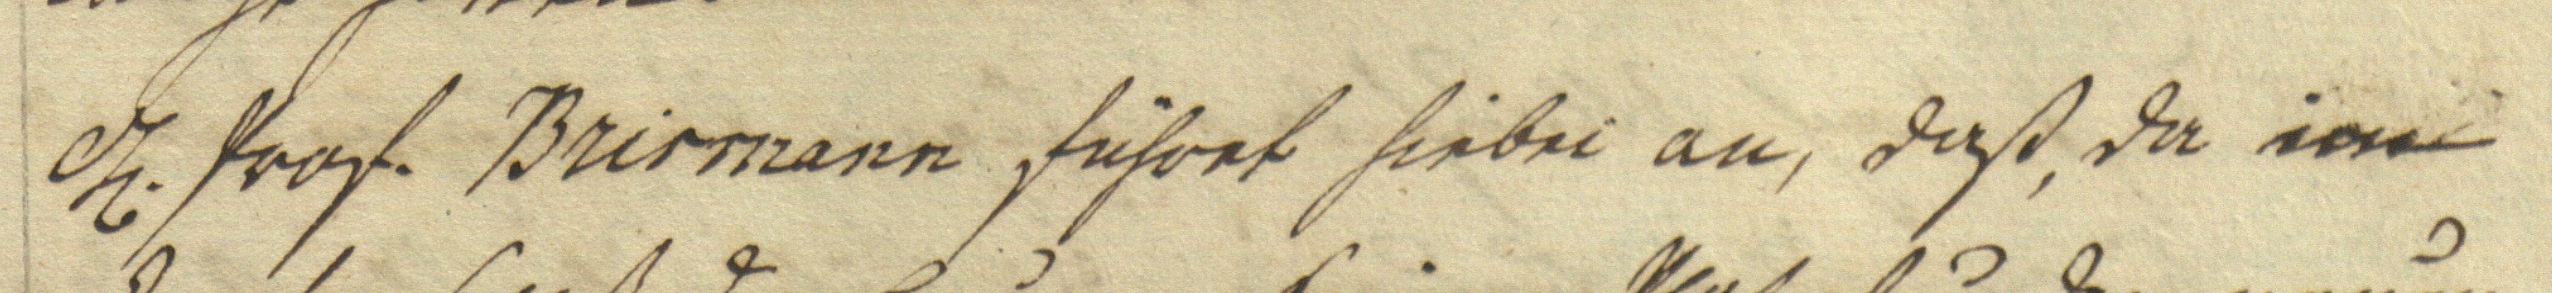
dh. Prof. Brismann führet hiebei an, daß, da im
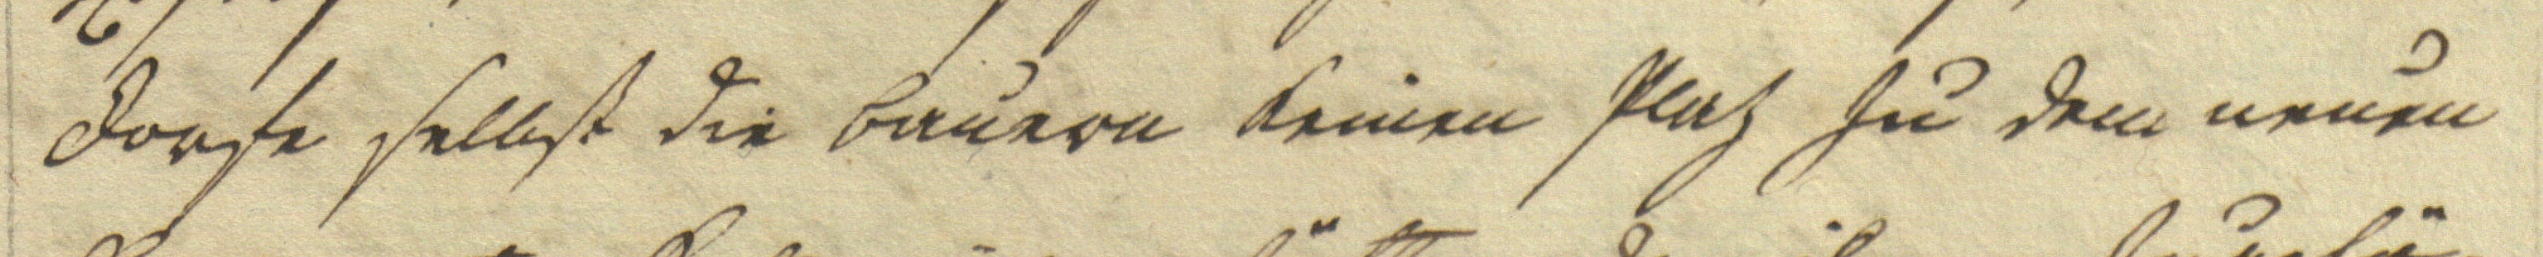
Dorfe selbst die Bauern keinen Platz zu dem neuen
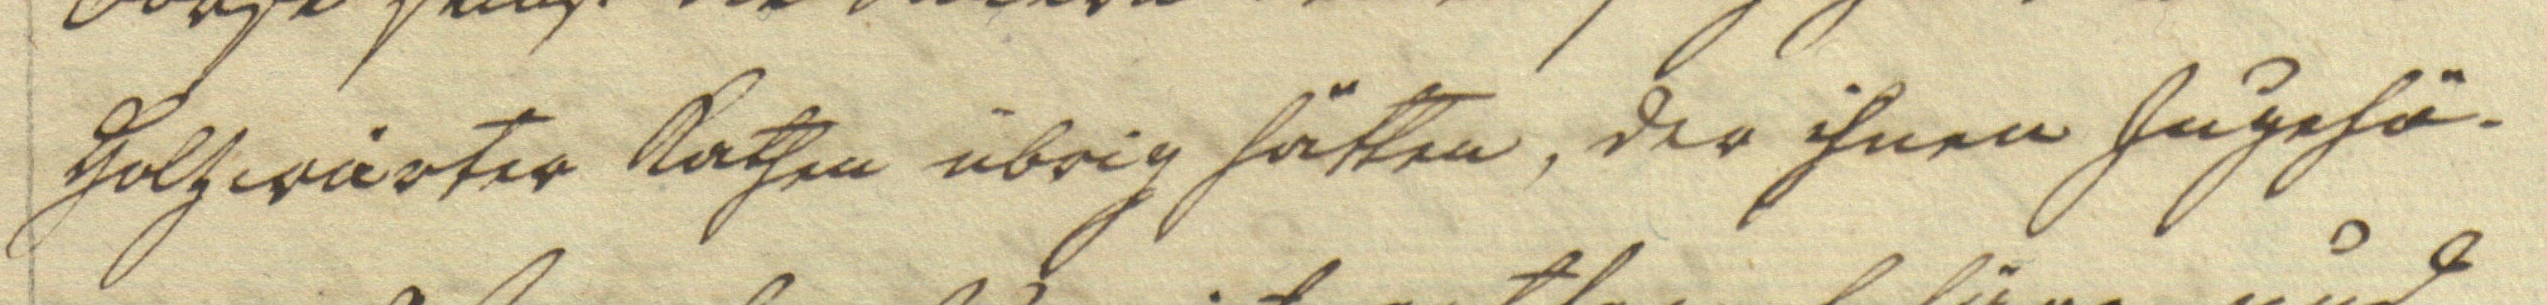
Holzwärter Kathen übrig hätten, der ihnen zugehö¬
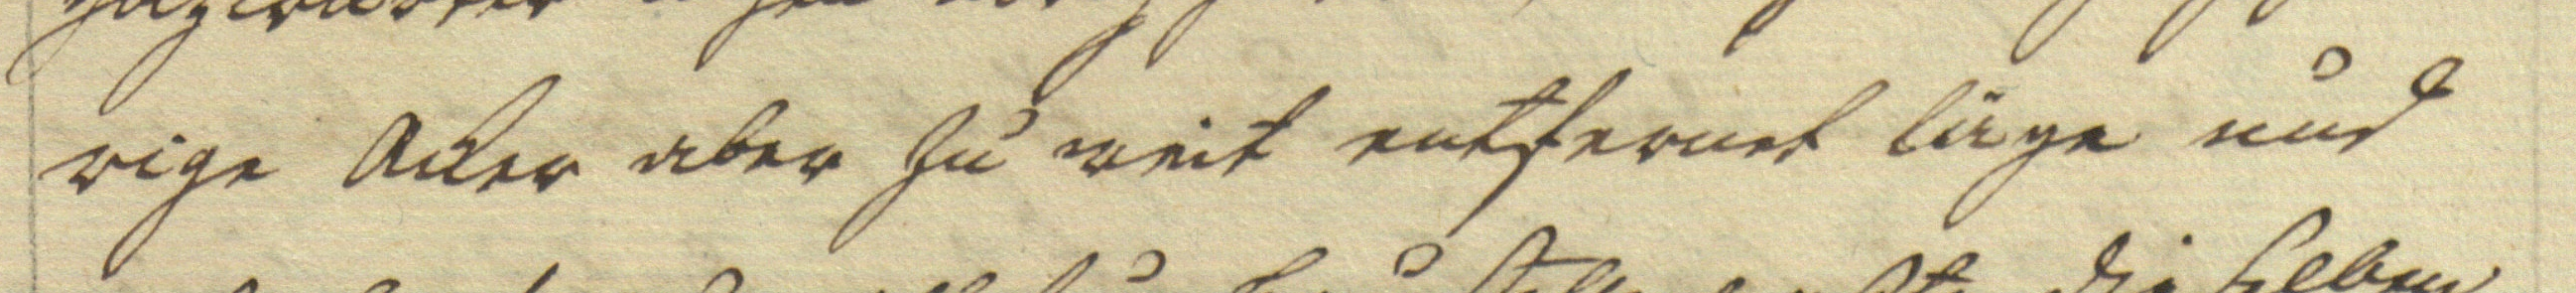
rige Acker aber zu weit entfernet läge und
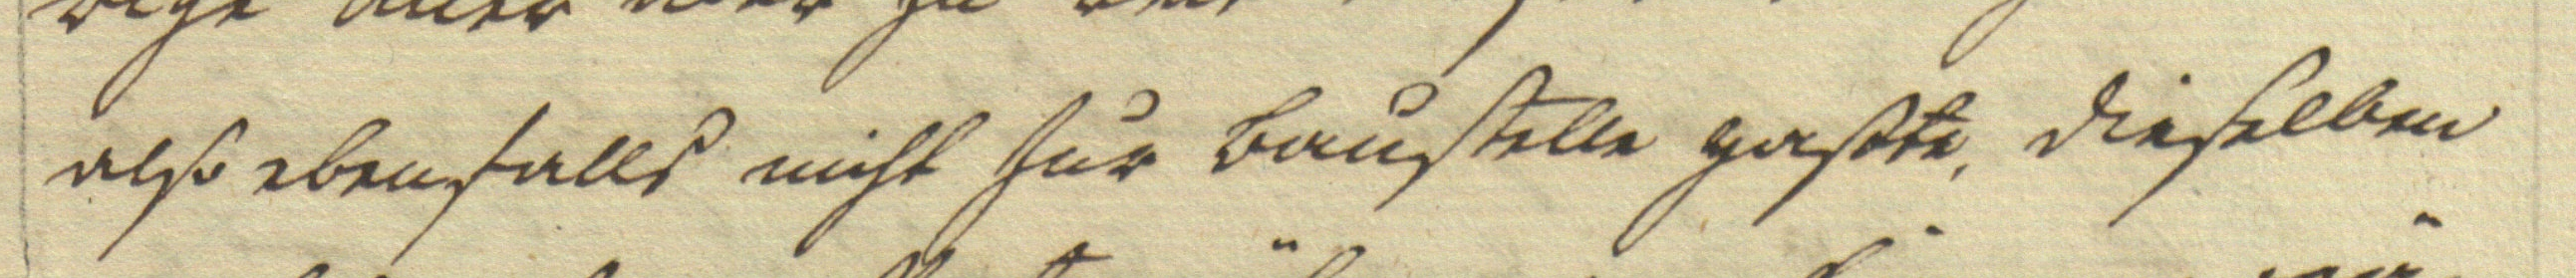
also ebenfalls nicht zur Baustelle paßte, dieselben
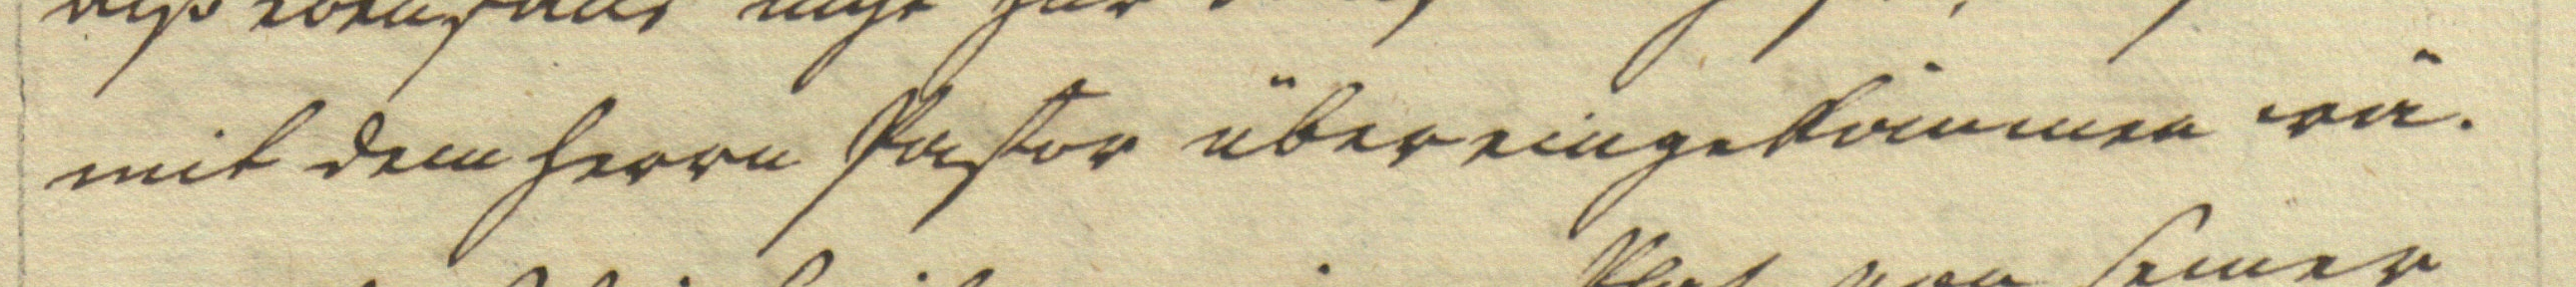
mit dem Herrn Pastor übereingekommen wä¬
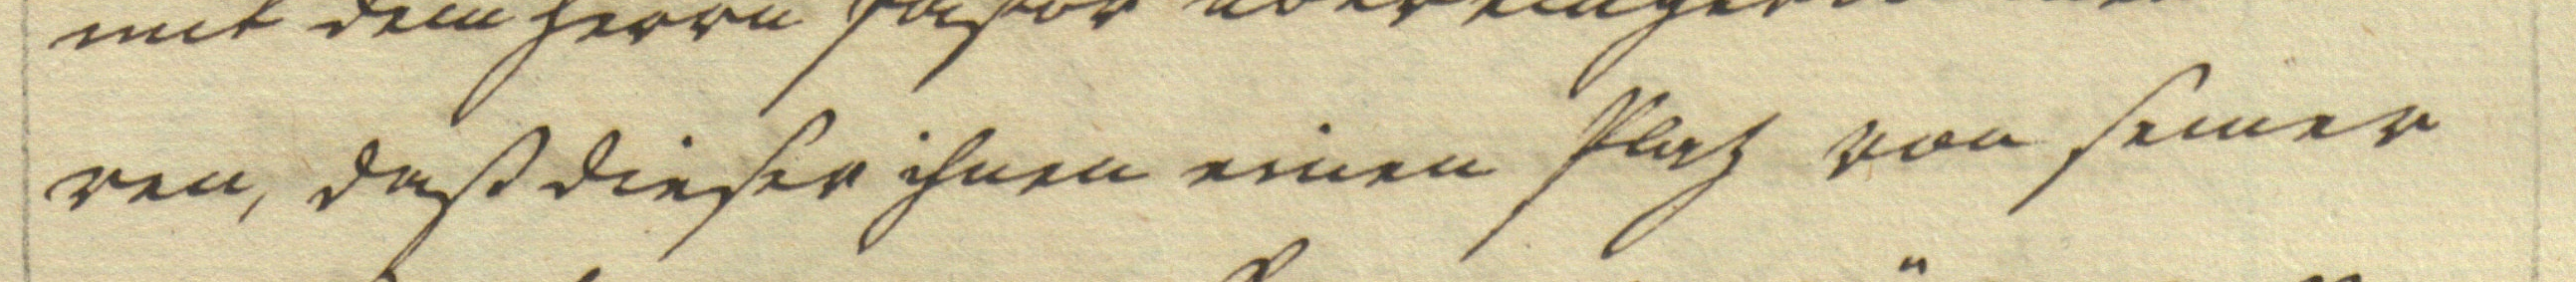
ren, daß dieser ihnen einen Platz von seiner
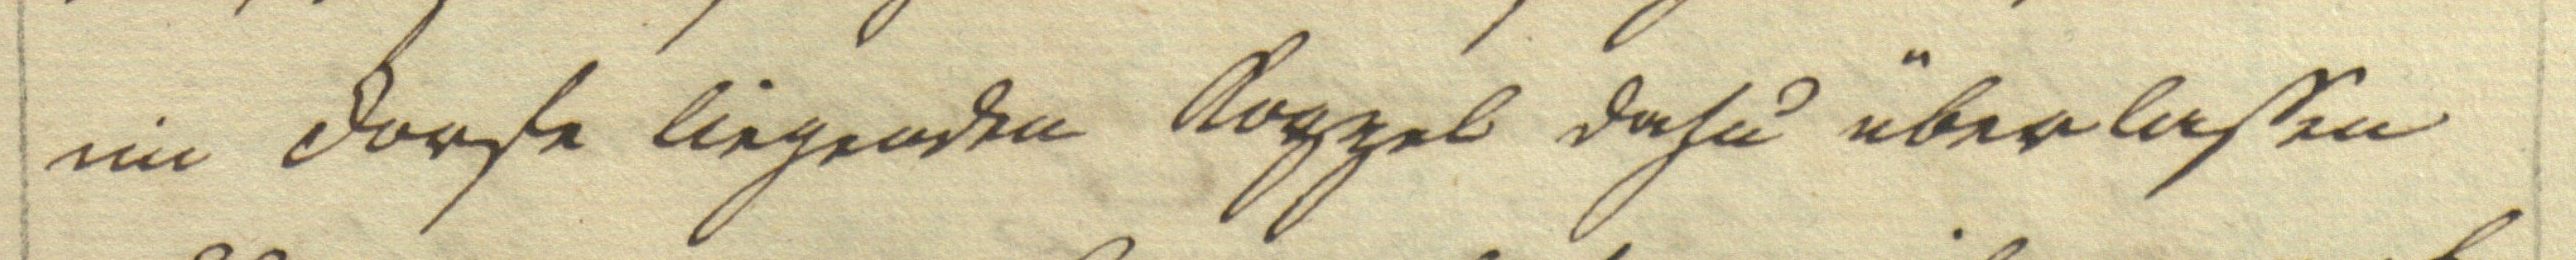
im Dorfe liegenden Koppel dazu überlassen
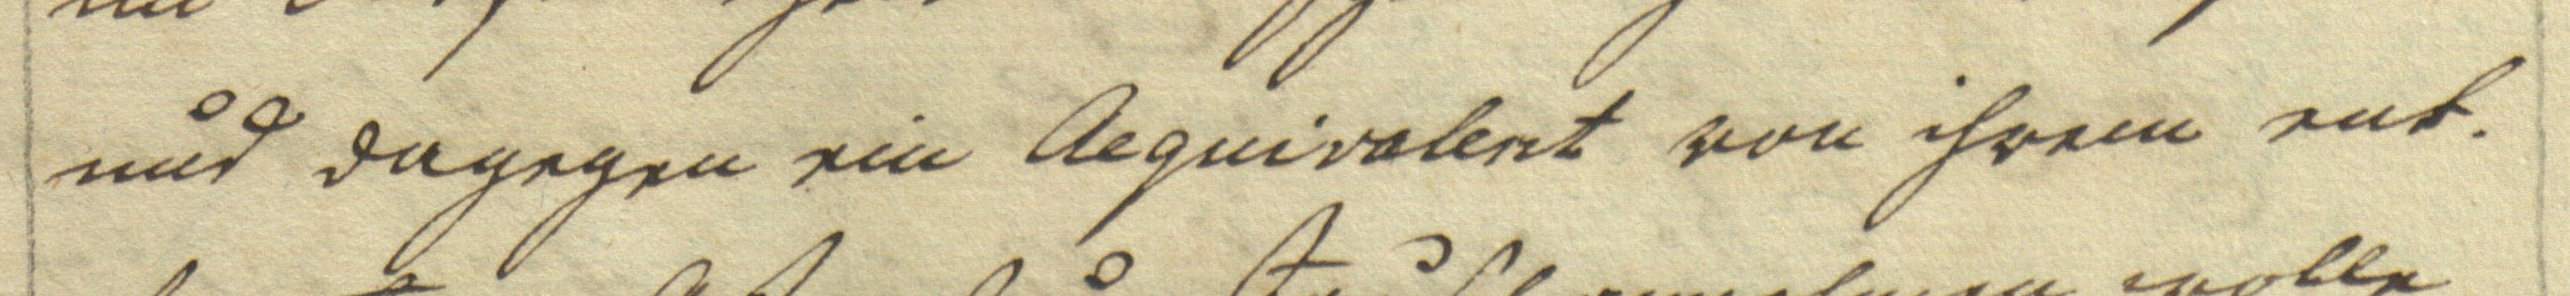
und dagegen ein Aequivalent von ihrem ent¬
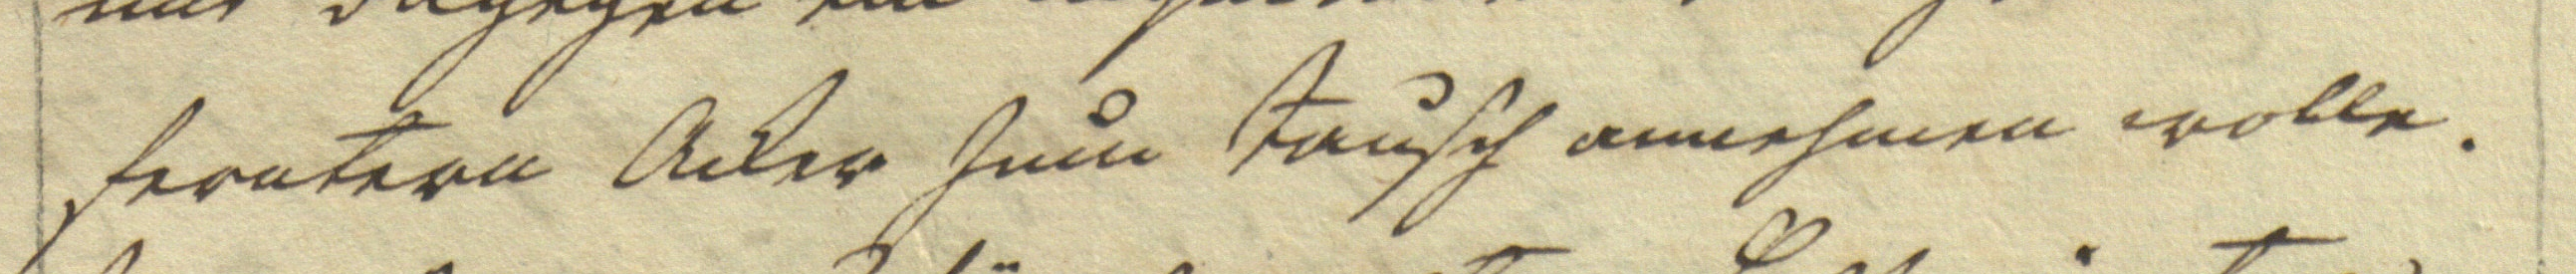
ferntern Acker zum Tausch annehmen wolle.
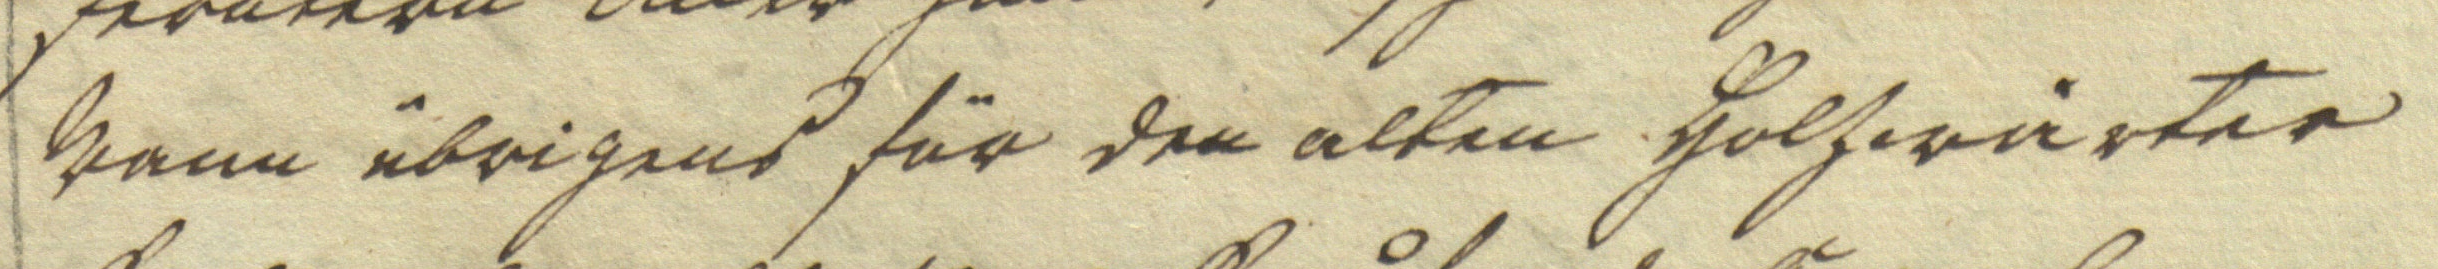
Wann übrigens für den alten Holzwärter
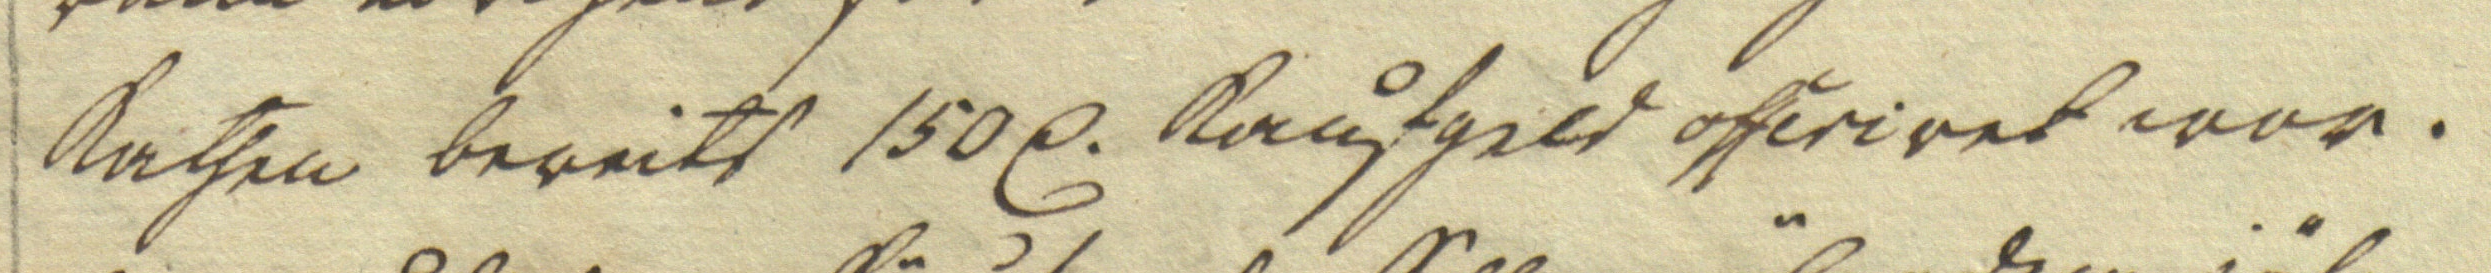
Kathen bereits 150 l. Kaufgeld offeriret wor¬
